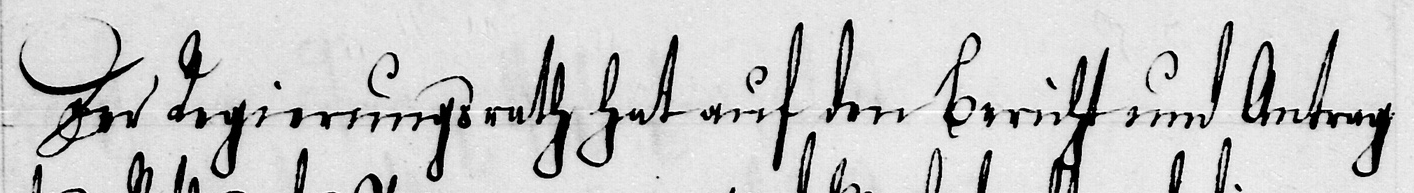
Der Regierungsrath hat auf den Bericht und Antrag
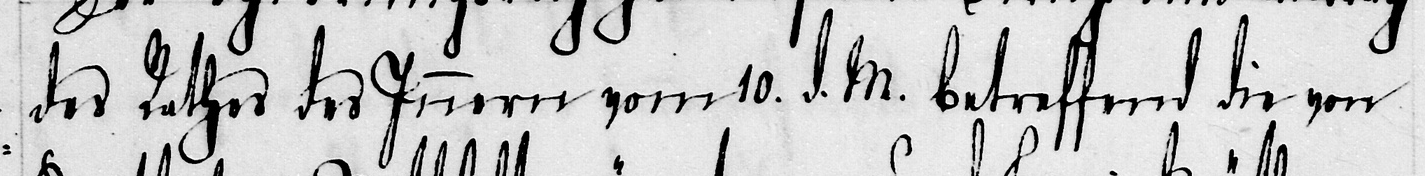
des Rathes des Innern vom 10. d. M. betreffend die von
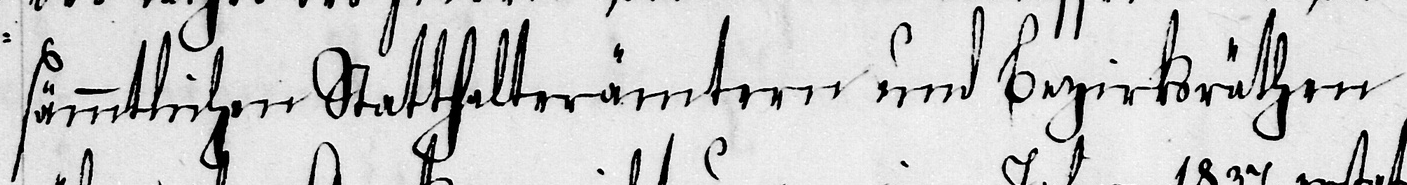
sämmtlichen Statthalterämtern und Bezirksräthen
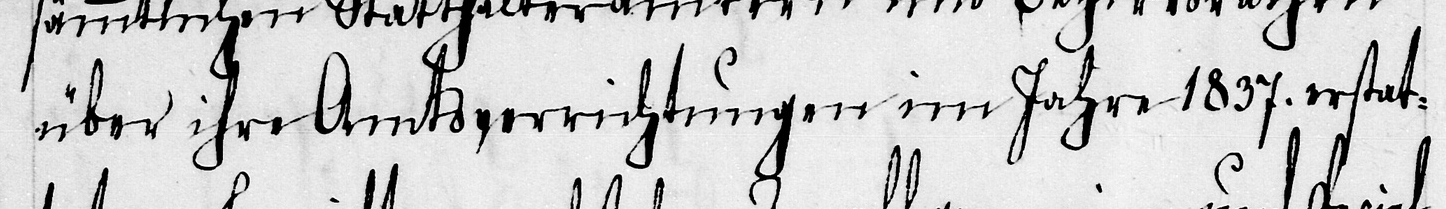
über ihre Amtsverrichtungen im Jahre 1837. erstat¬
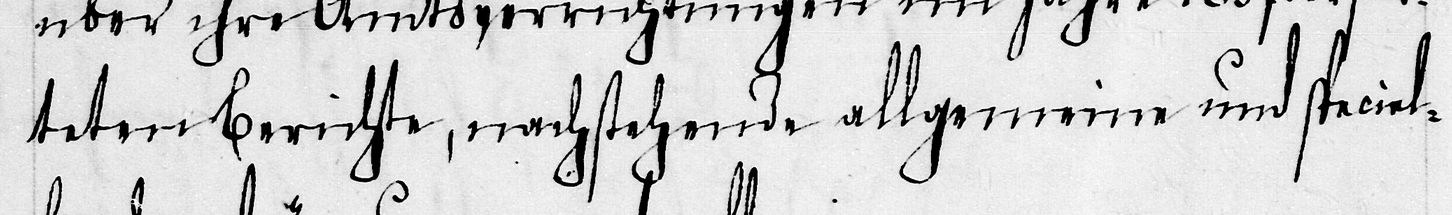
teten Berichte, nachstehende allgemeine und specie¬
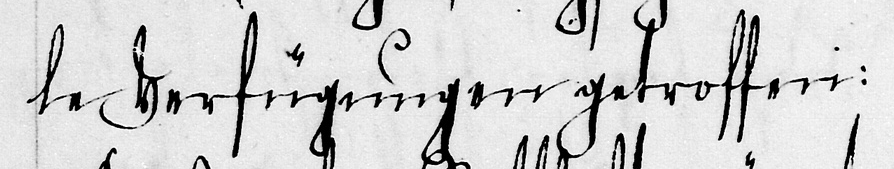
le Verfügungen getroffen:
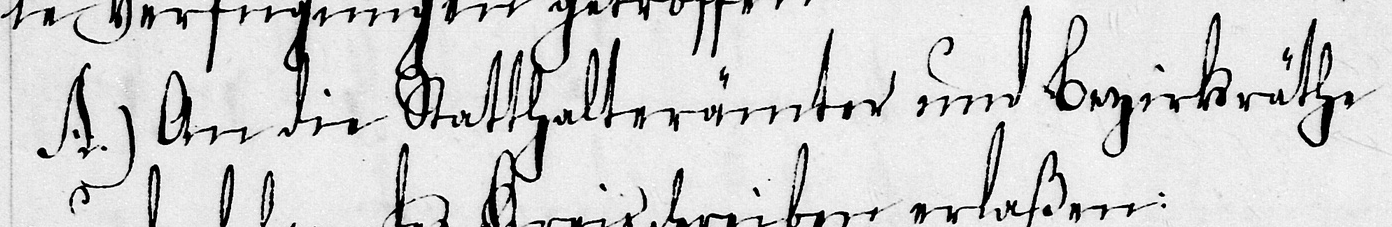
A.) An die Statthalterämter und Bezirksräthe
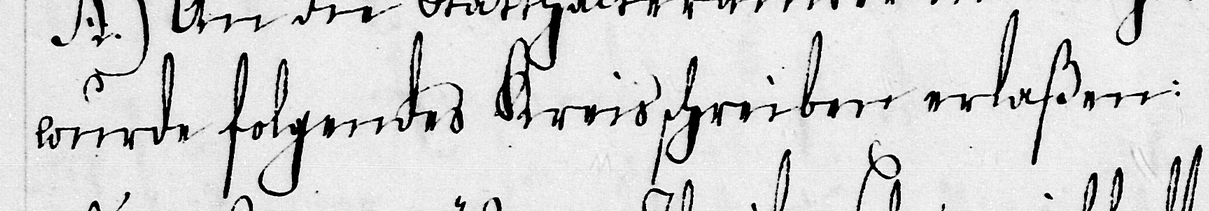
wurde folgendes Kreisschreiben erlaßen:
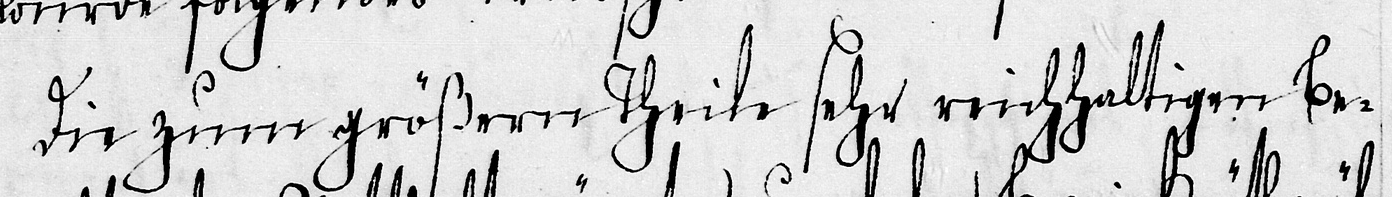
Die zum größern Theile sehr reichhaltigen Be¬
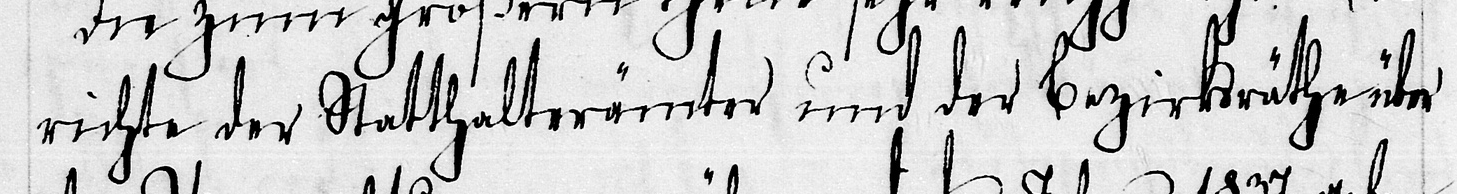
richte der Statthalterämter und der Bezirksräthe über
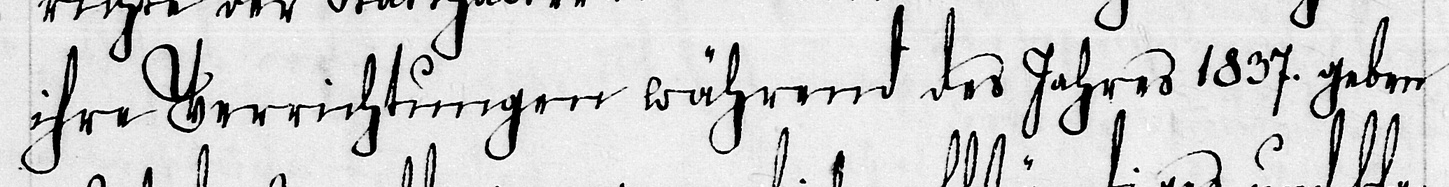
ihre Verrichtungen während des Jahres 1837. geben
